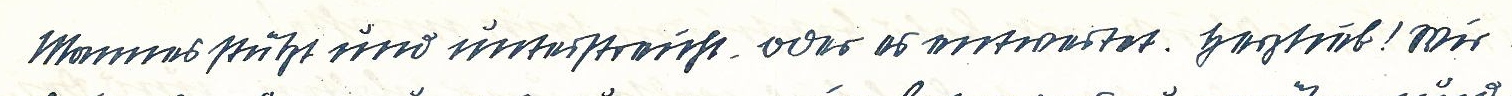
Mannes stützt und unterstreicht, oder es entwertet. Herzlieb! Wir
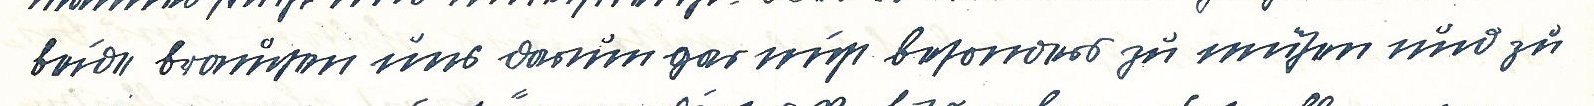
beide brauchen uns darum gar nicht besonders zu mühen und zu
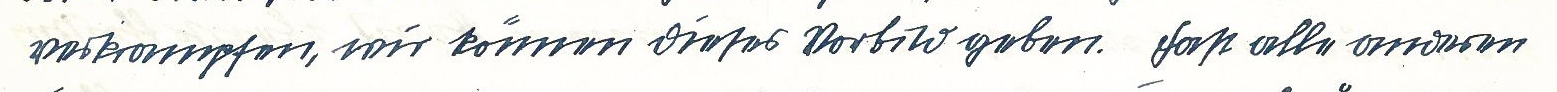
verkrampfen, wir können dieses Vorbild geben. Fast alle anderen
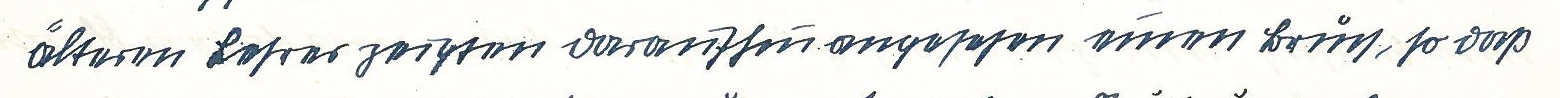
älteren Lehrer zeigten daraufhin angesehen einen Bruch, so daß
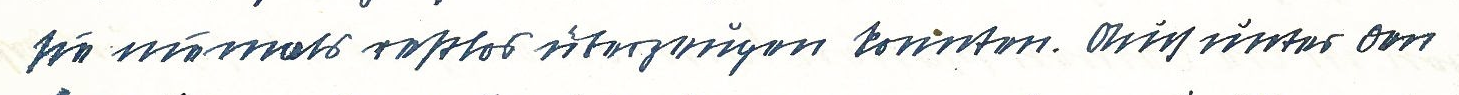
sie niemals restlos überzeugen konnten. Auch unter den
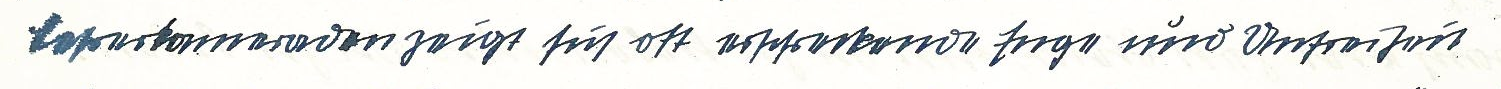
Lehrerkameraden zeigt sich oft erschreckende Enge und Unfreiheit
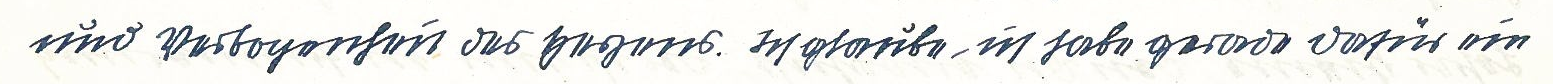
und Verbogenheit des Herzens. Ich glaube, ich habe gerade dafür ein
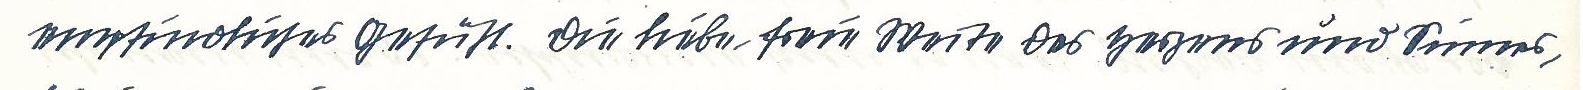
empfindliches Gefühl. Die liebe, freie Weite des Herzens und Sinnes,
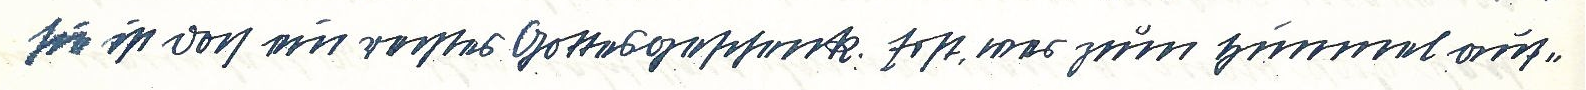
sie ist doch ein rechtes Gottesgeschenk. Erst, wer zum Himmel auf¬
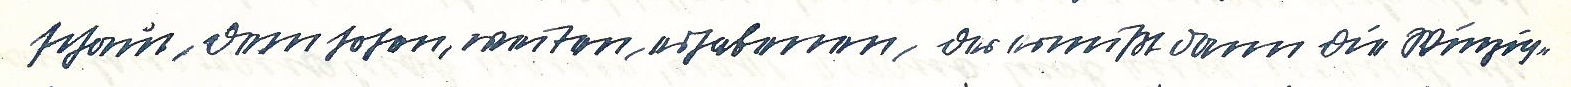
schaut, dem hohen, weiten, erhabenen, der ermißt dann die Winzig¬
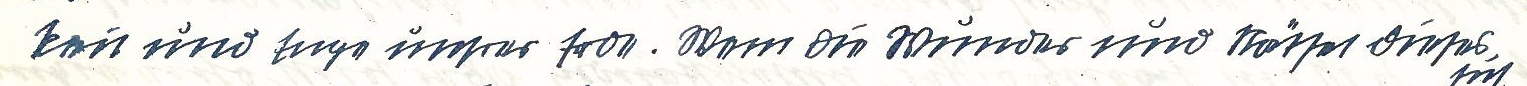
keit und Enge unsrer Erde. Wem die Wunder und Rätsel dieses
